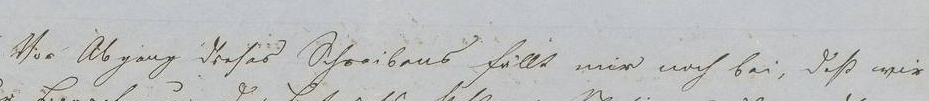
Vor Abgang dieses Schreibens fällt mir noch bei, daß wir
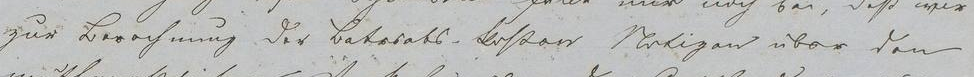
zur Berechnung der Betriebs-Kosten Notizen über den
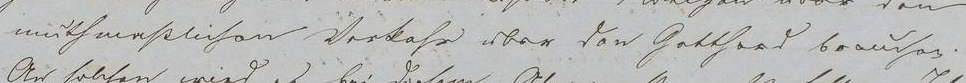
muthmaßlichen Verkehr über den Gotthard brauchen.
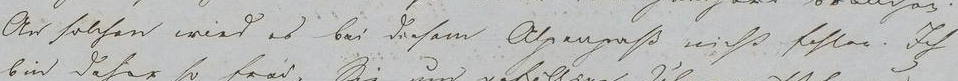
An solchen wird es bei diesem Alpenpaß nicht fehlen. Ich
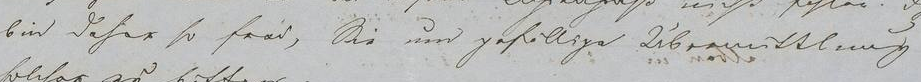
bin daher so frei, Sie um gefälllige Übermittlung
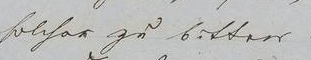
solcher zu bitten.
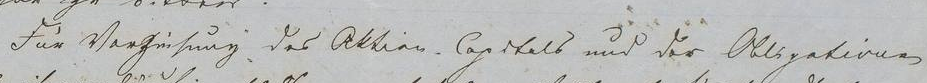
Für Verzinsung des Aktien-Capitals und der Obligationen
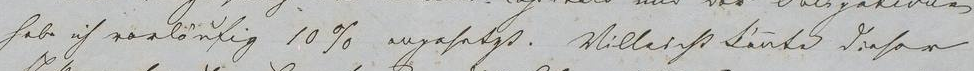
habe ich vorläufig 10% angesetzt. Villeicht könnte dieser
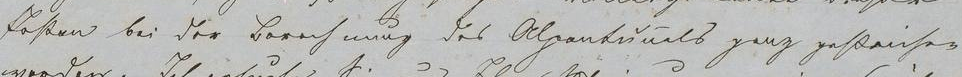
Posten bei der Berechnung des Alpentunnels ganz gestrichen
